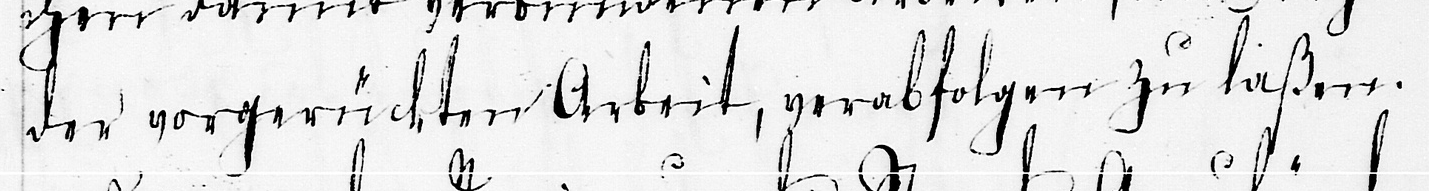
der vorgerückten Arbeit, verabfolgen zu laßen.
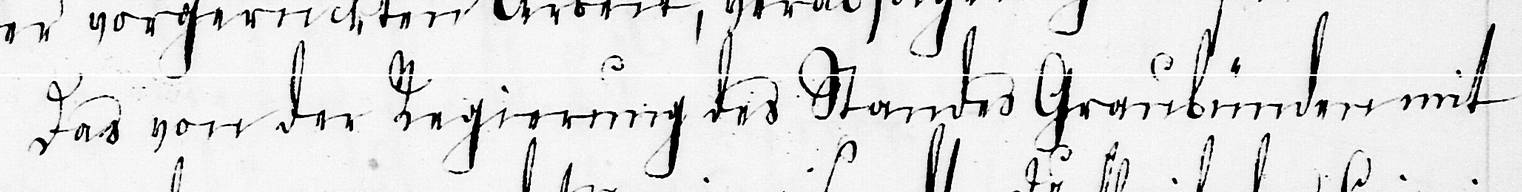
Das von der Regierung des Standes Graubünden mit
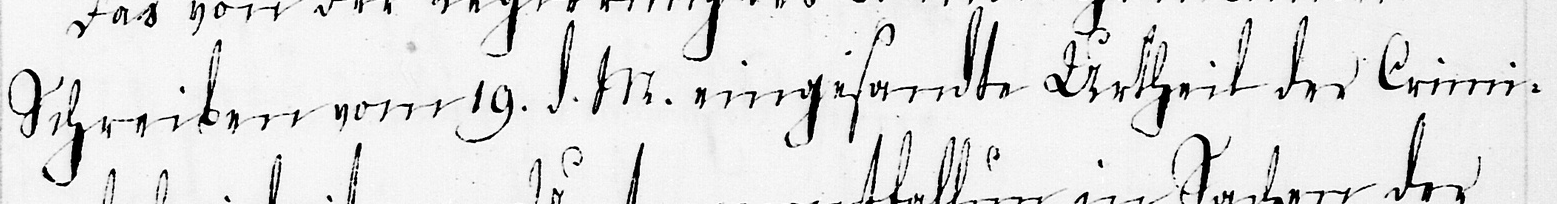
Schreiben vom 19. d. M. eingesandte Urtheil der Crimi¬
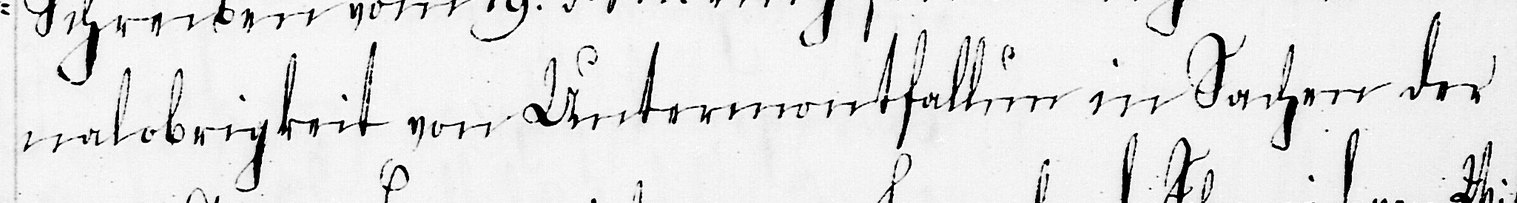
nalobrigkeit von Untermontfallun in Sachen der
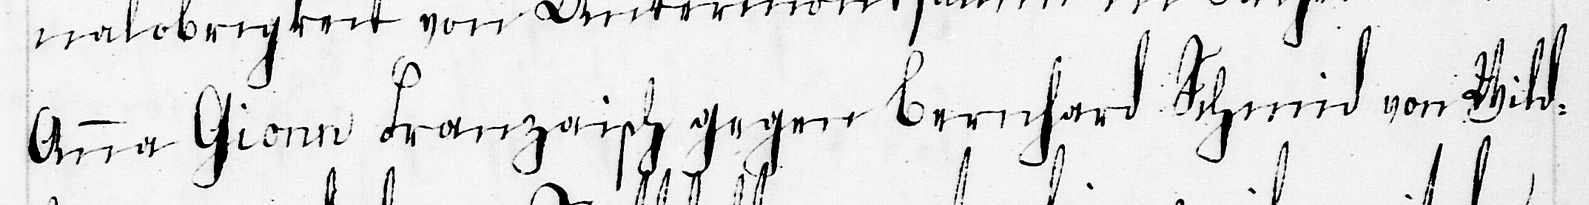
Anna Gionn Franzaisch gegen Bernhard Schmid von Wild¬
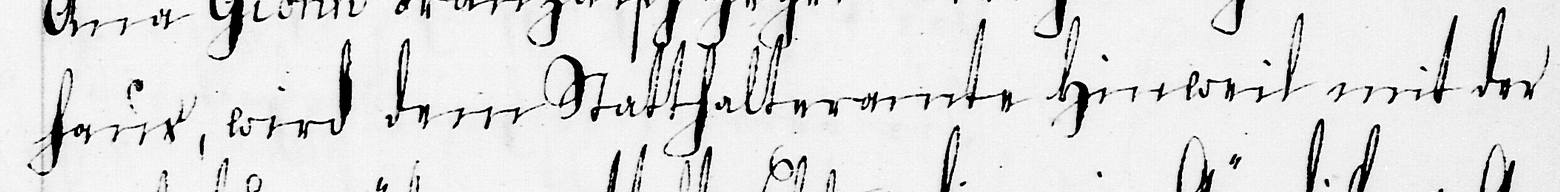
haus, wird dem Statthalteramte Hinweil mit der
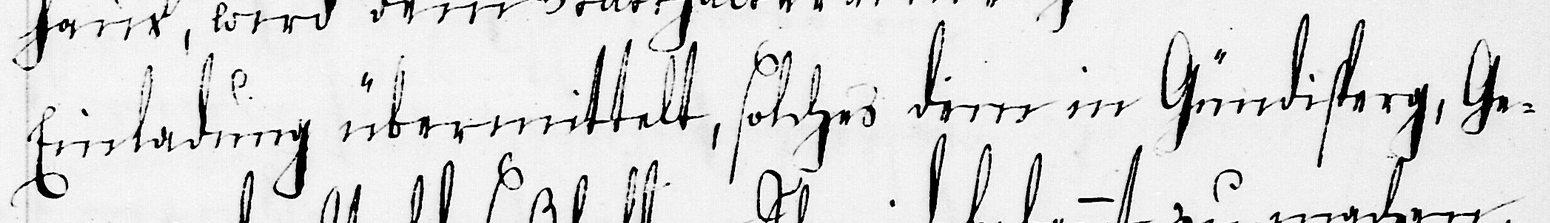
Einladung übermittelt, solches dem in Gündisperg, Ge¬
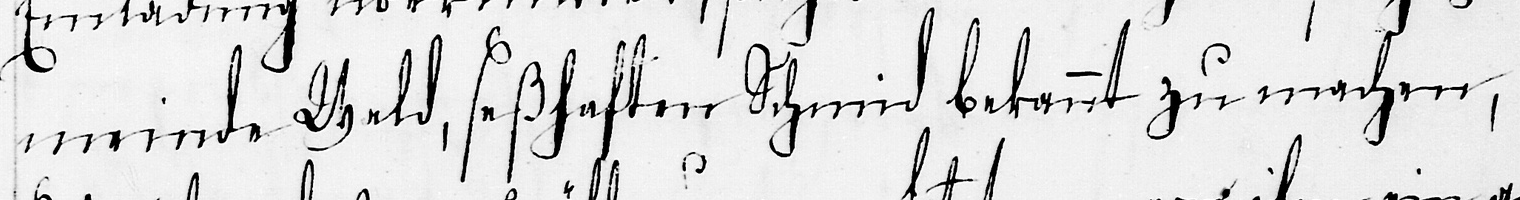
meinde Wald, seßhaften Schmid bekannt zu machen,
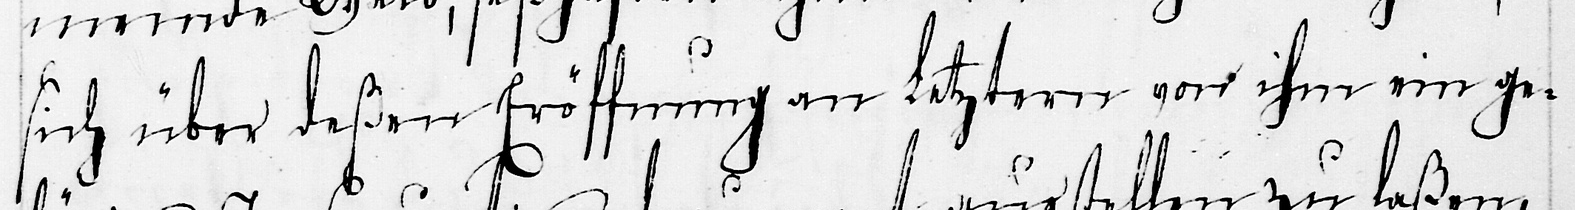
sich über deßen Eröffnung an Letztern von ihm ein ge¬
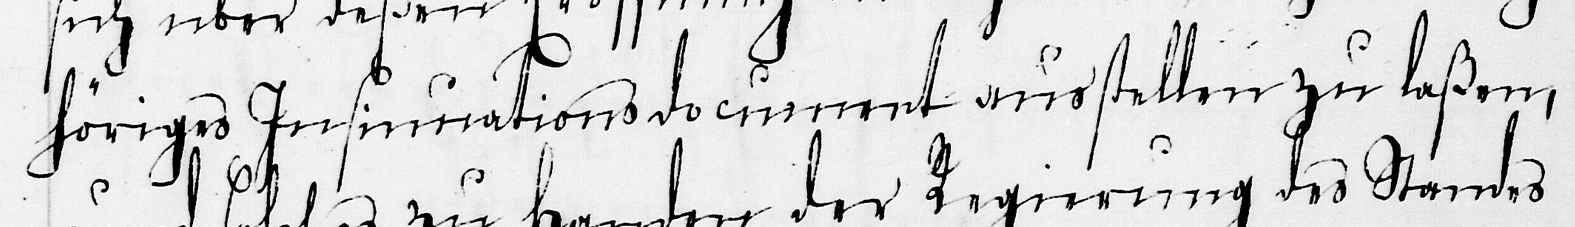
höriges Insinuationsdocument ausstellen zu laßen,
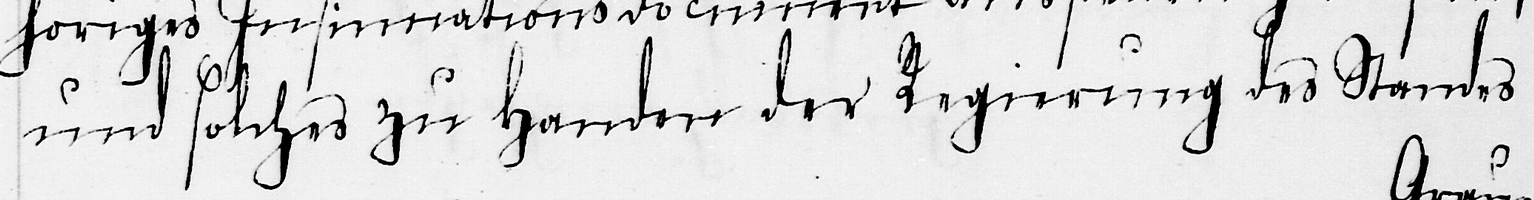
und solches zu Handen der Regierung des Standes
